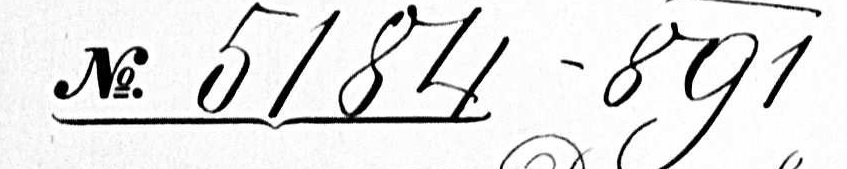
No. 5184 – 891
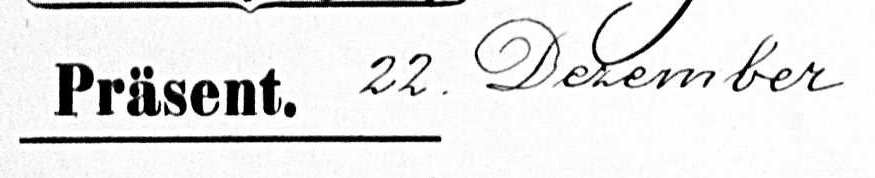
Präsent. 22. Dezember
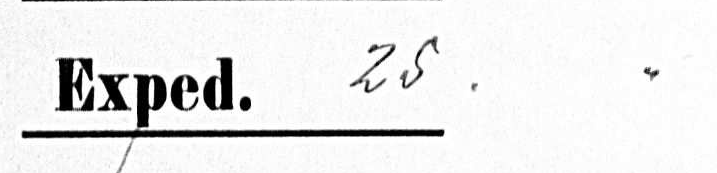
Expedit 25. „
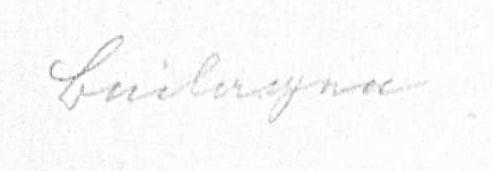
Beilagen
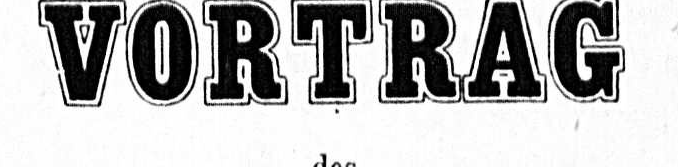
VORTRAG
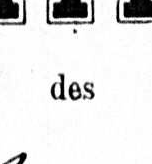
Des
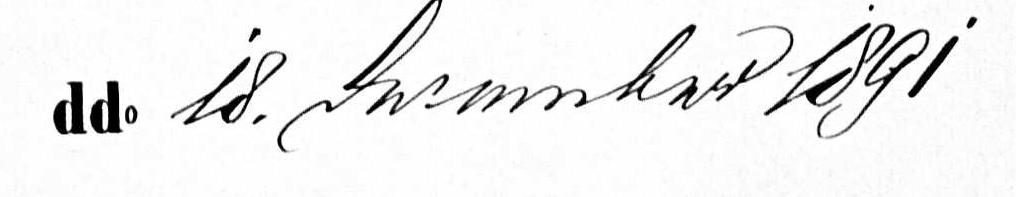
ddo 18 Dezember 1891
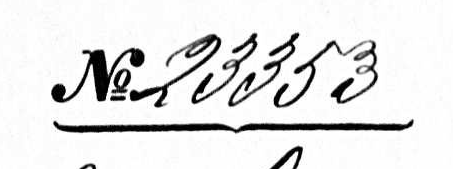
No 23353
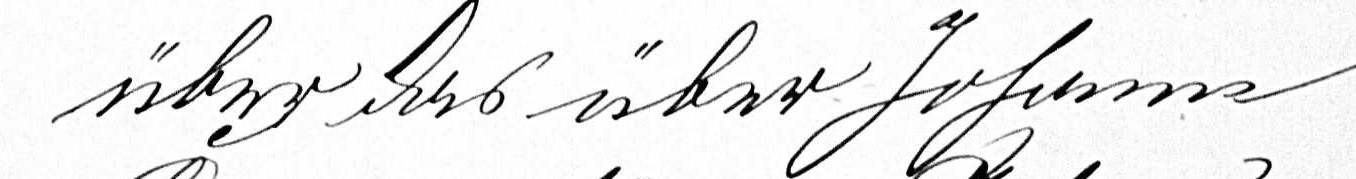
über das über Johann
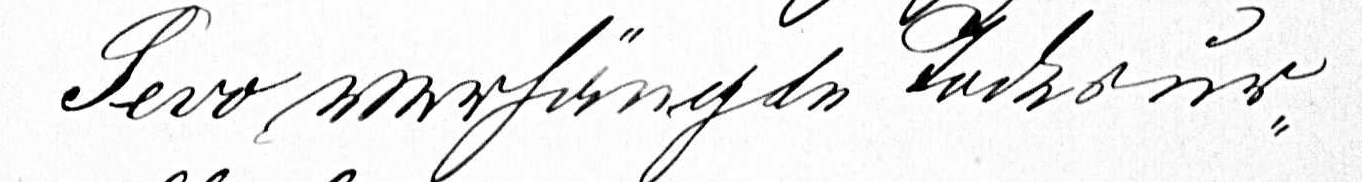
Ševo verhängte Todesur¬
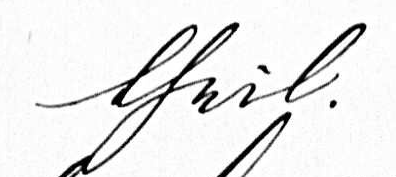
theil.
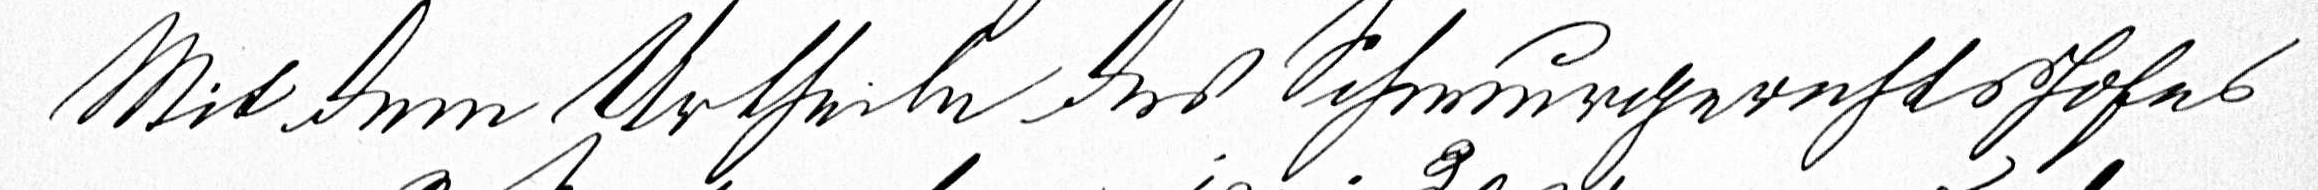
Mit dem Urtheile des Schwurgerichtshofes
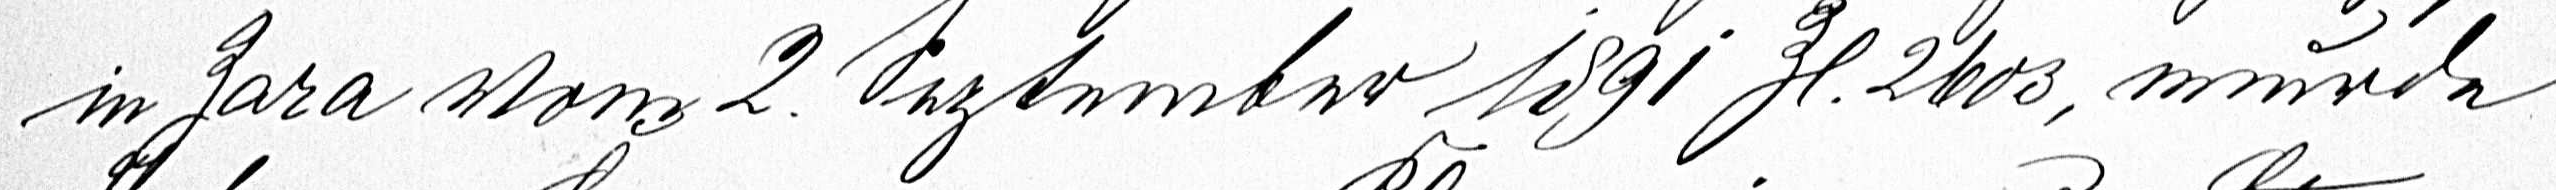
in Zara vom 2. September 1891 Zl. 2603, wurde
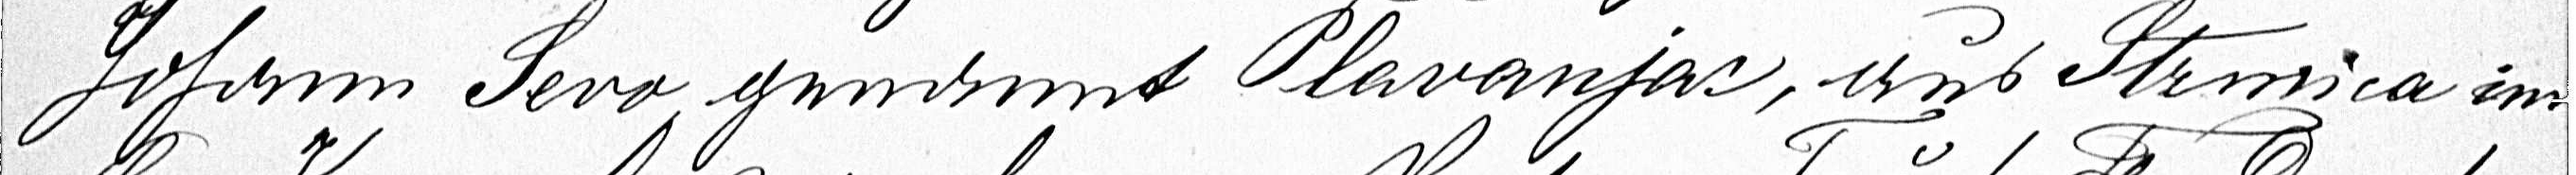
Johann Ševo genannt Plavanjac, aus Strmica im
